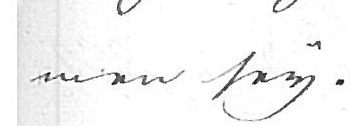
men sey.
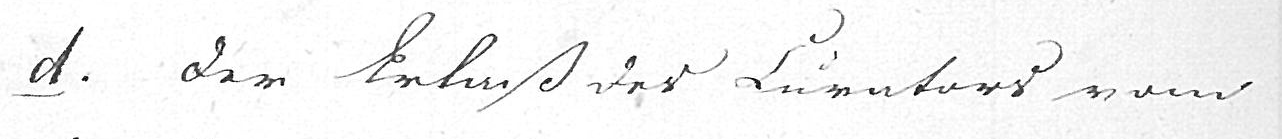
d. Der Erlaß des Curators vom
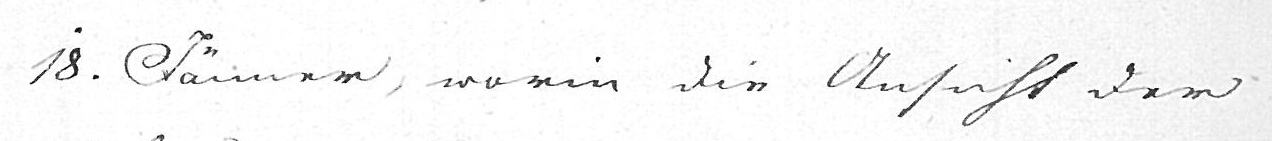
18. Jänner, worin die Ansicht der
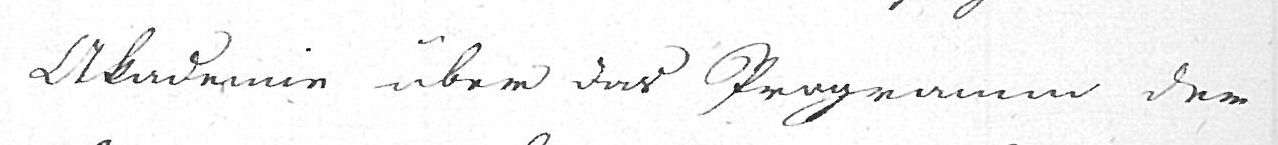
Akademie über das Programm der
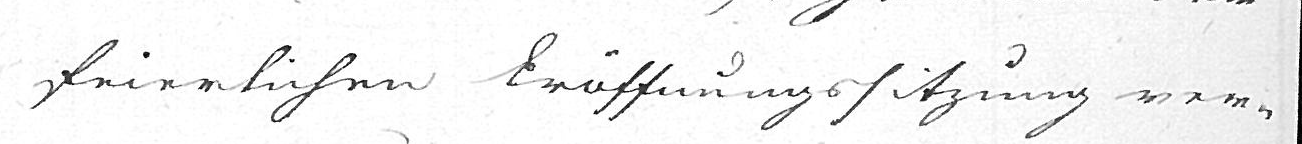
feierlichen Eröffnungssitzung ver-
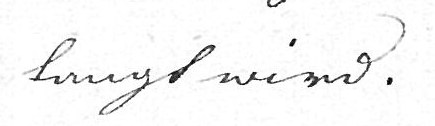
langt wird.
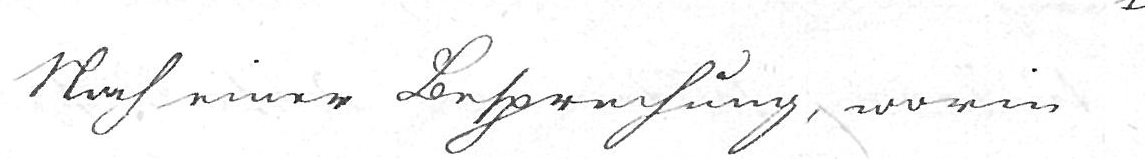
Nach einer Besprechung, worin
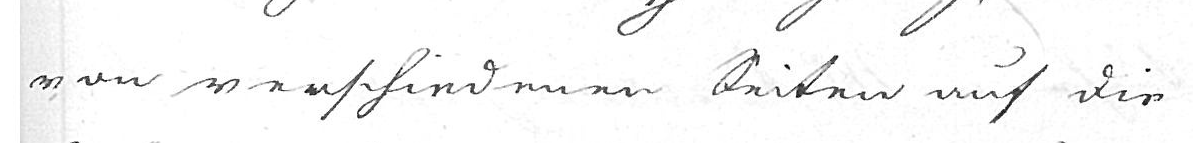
von verschiedenen Seiten auf die
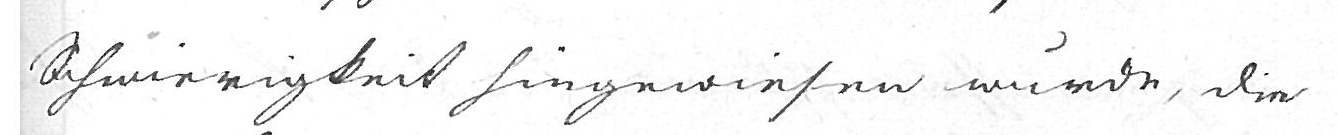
Schwierigkeit hingewiesen wurde, die
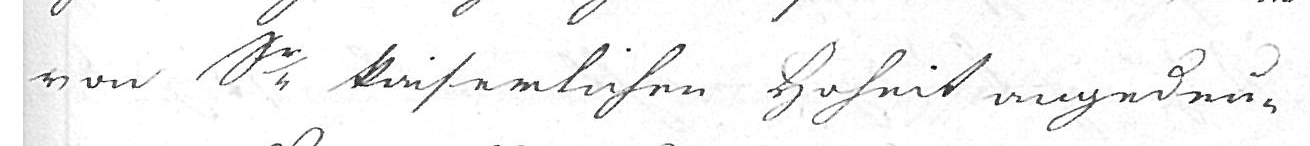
von Sr. kaiserlichen Hoheit angedeu.
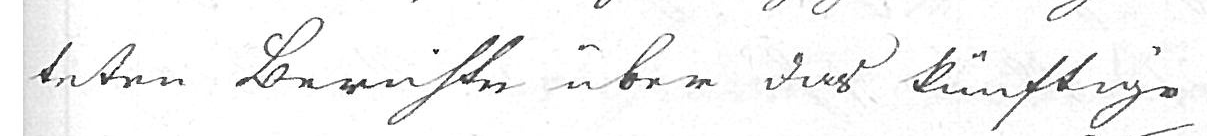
teten Berichte über das künftige
